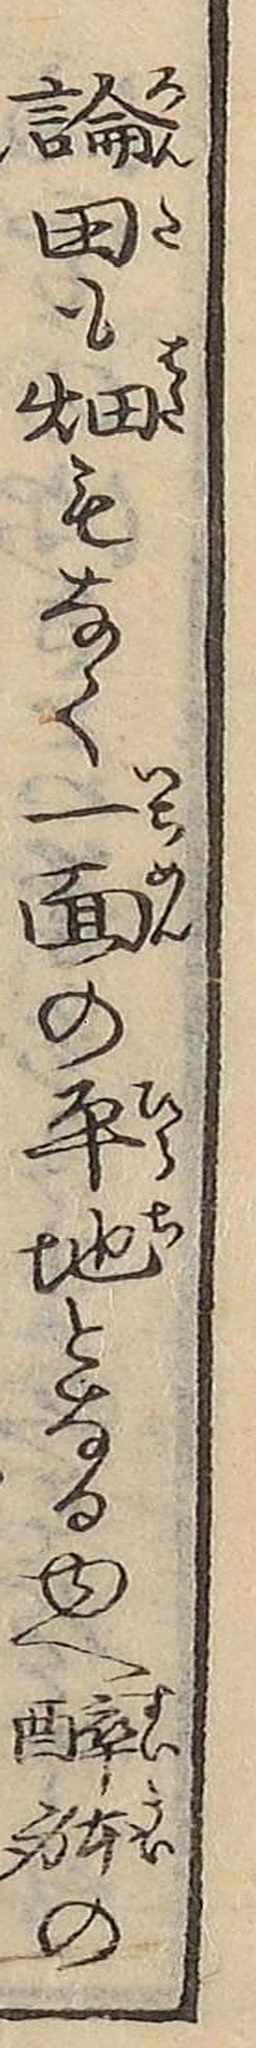論田も畑もなく一面の平地となるゆへ酔体の
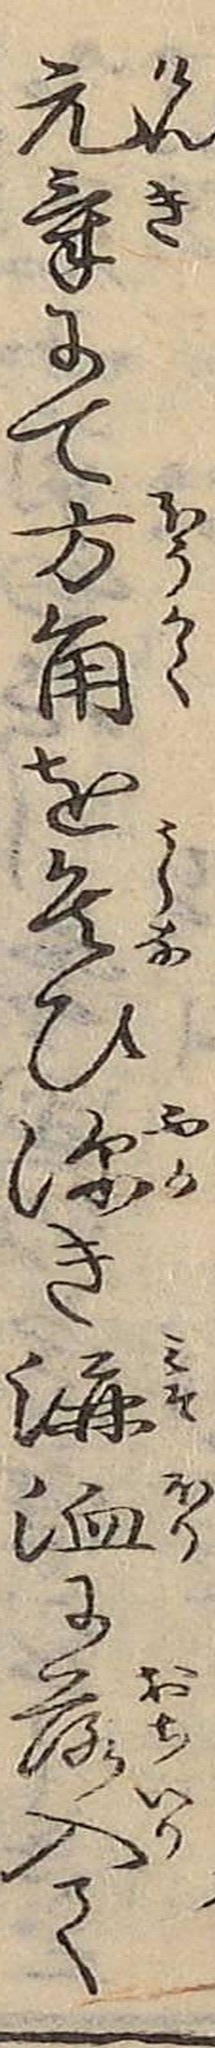元気にて方角を失ひ深き溝洫に落入て
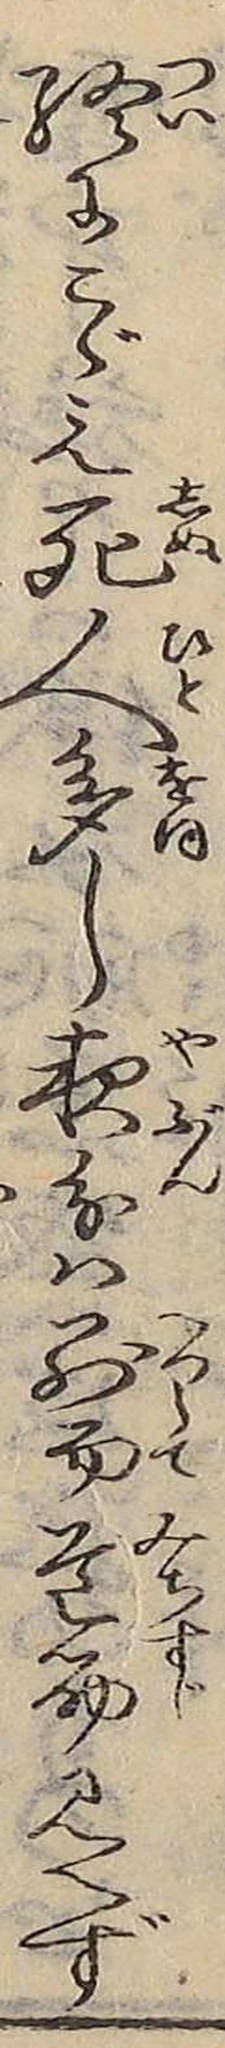終にこゞえ死人多し夜分は別而道筋見へず
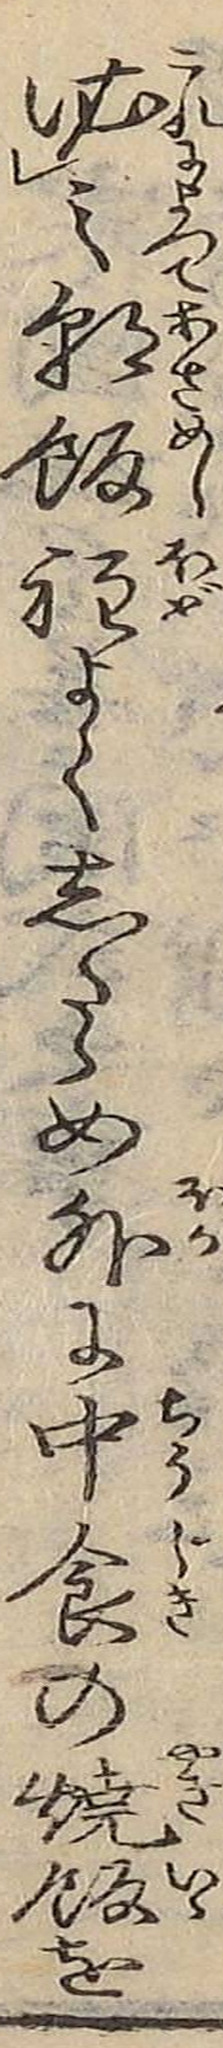依之朝飯程よくしたゝめ外に中食の焼飯を
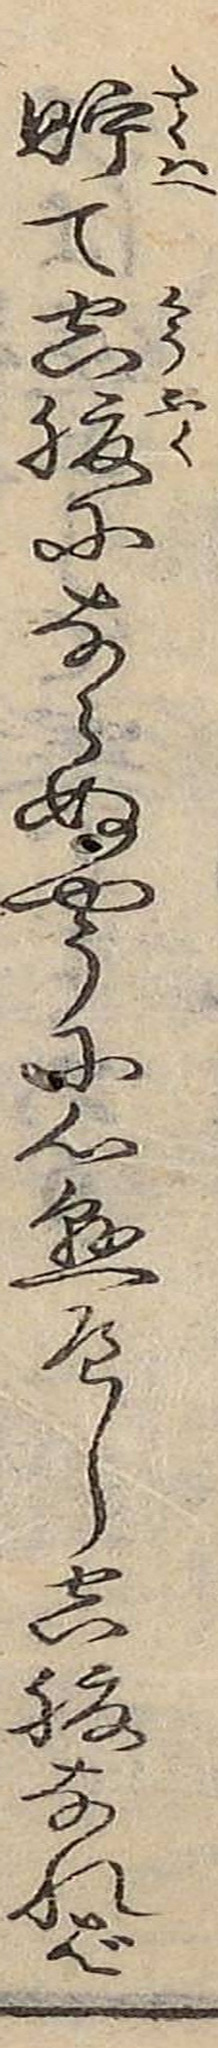貯て空腹にならぬやうに心懸へし空腹なれば
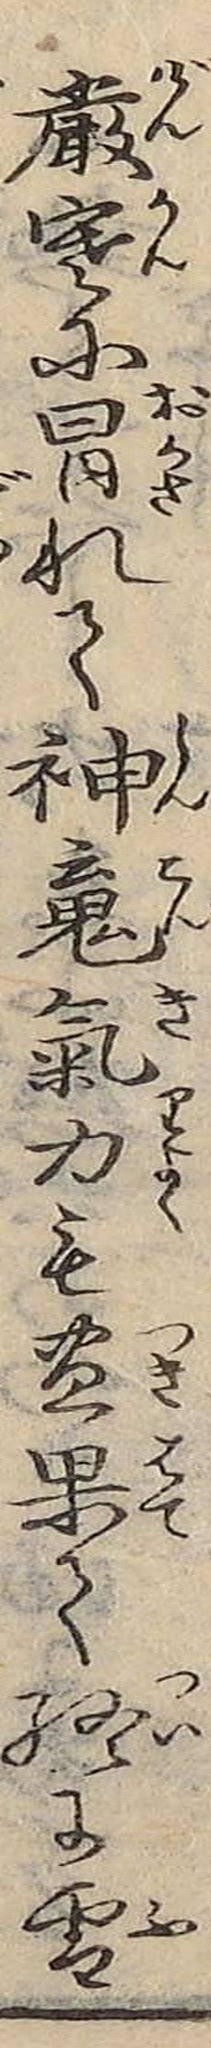厳寒に冒れて神魂気力も尽果て終に雪
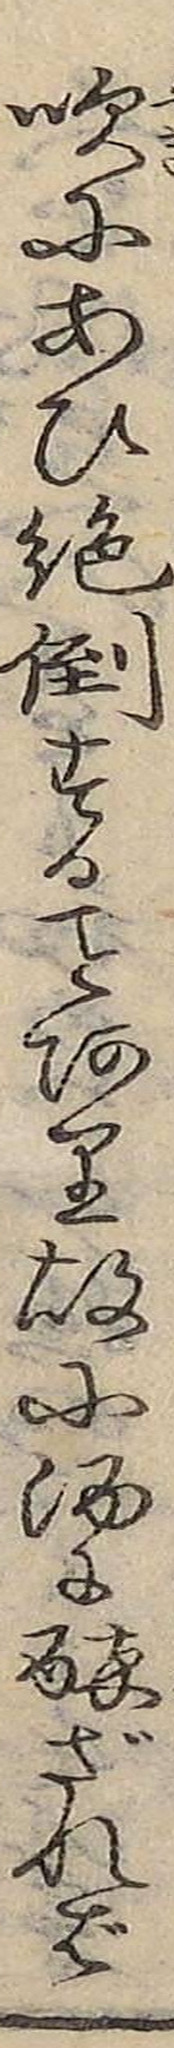吹にあひ絶倒することあり故に酒に酔ざれば
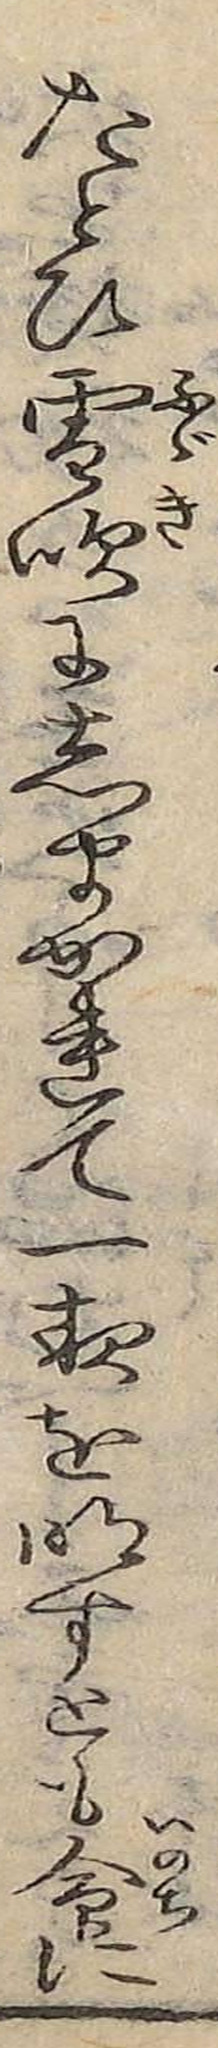たとひ雪吹にしまかれて一夜を明すとも命に
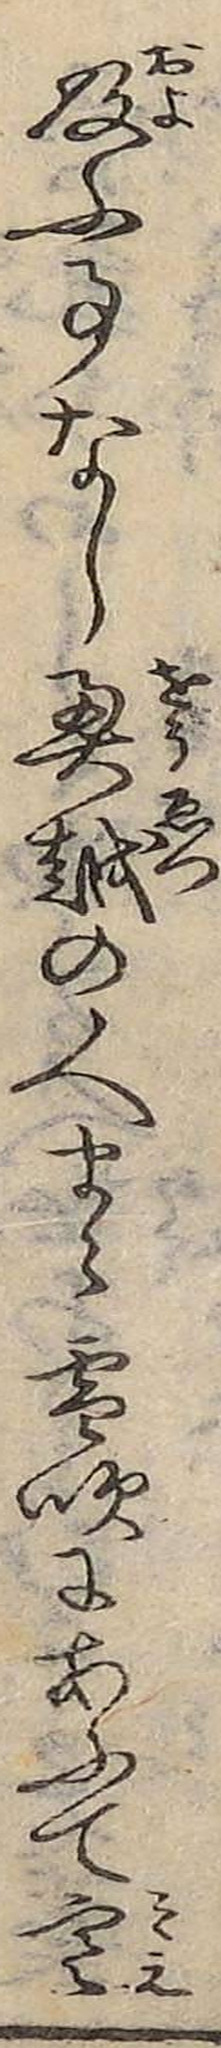及ふ事なし奥越の人まゝ雪吹にあふて寒
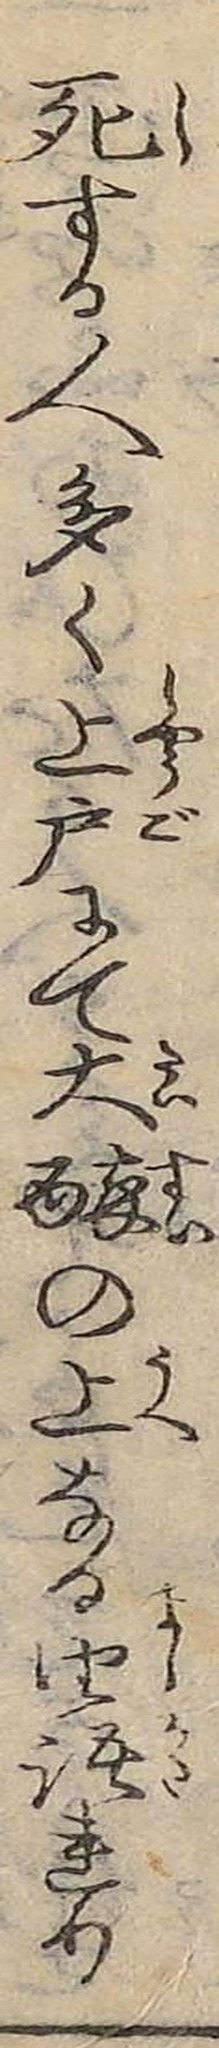死する人多く上戸にて大酔の上なる由語れり

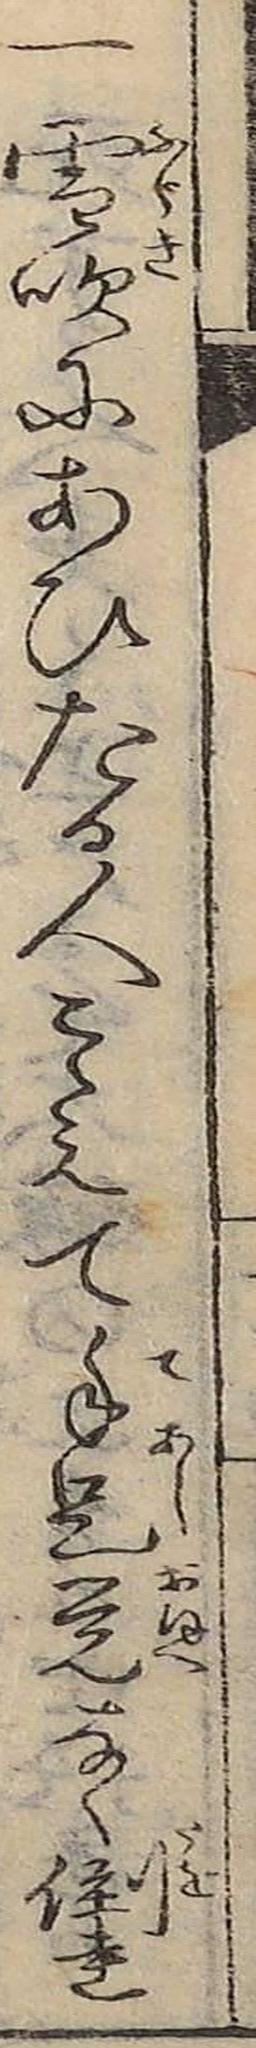一雪吹にあひたる人こゝえて手足覚なく倒れ
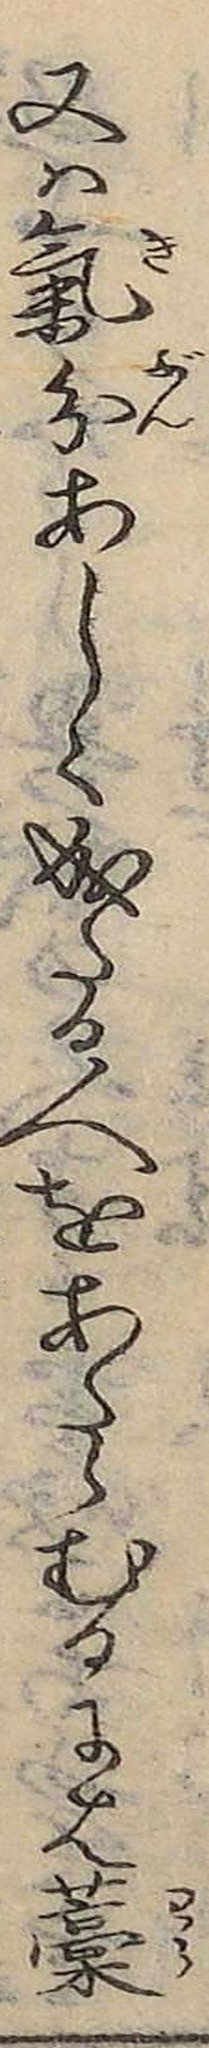又は気分あしく成たる人をあたゝむるには藁
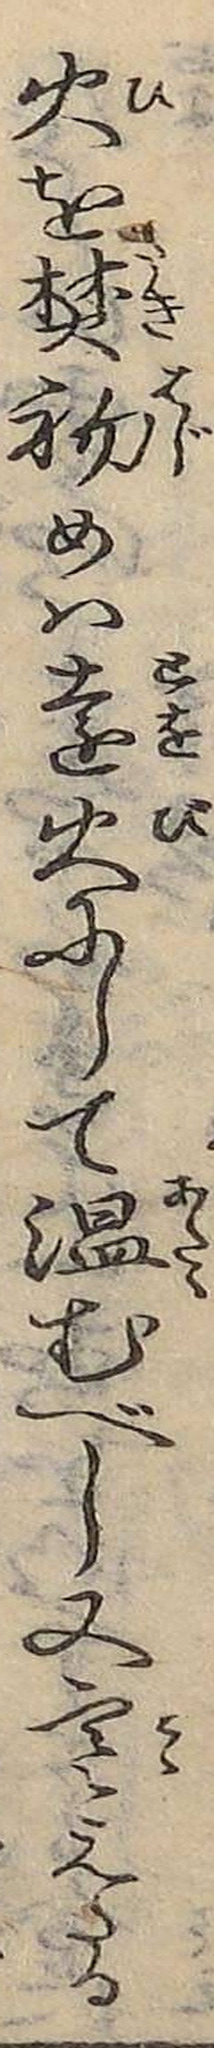火を焚初めは遠火にして温むべし又寒えたる
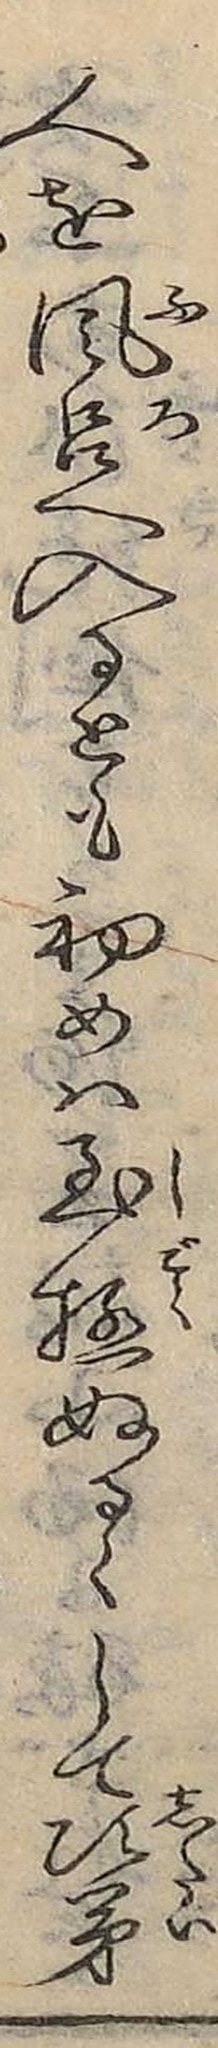人を風呂へ入るとも初めは至極ぬるくして次第
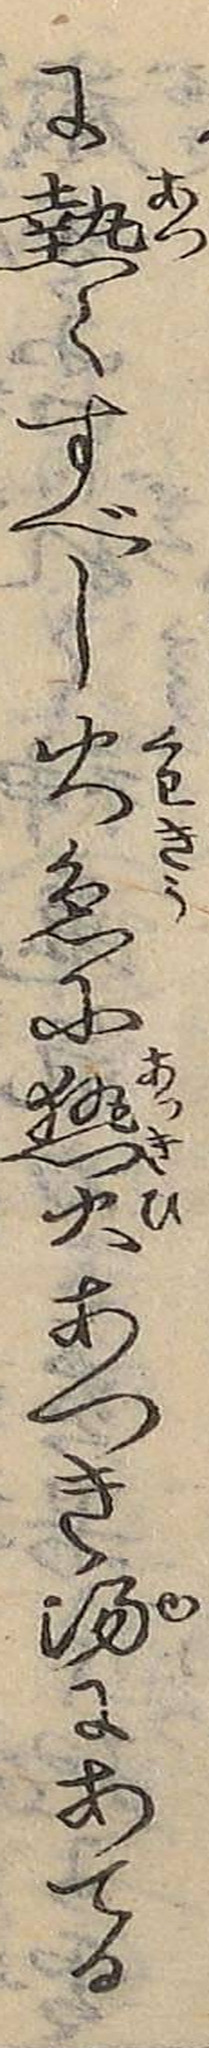に熱くすべし火急に熱火あつき湯にあてる
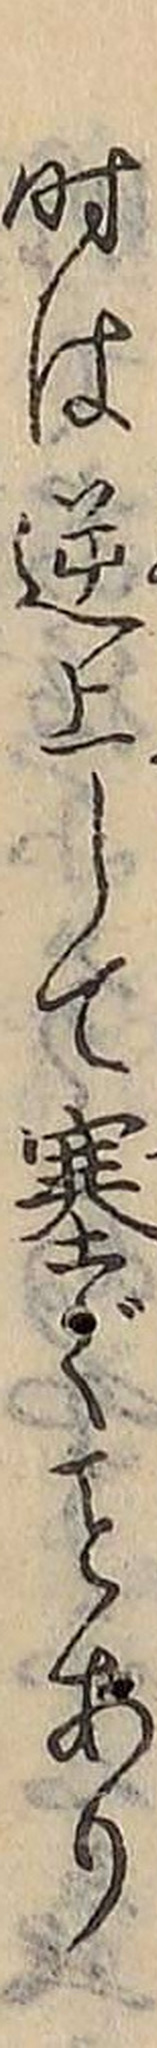時は逆上して塞ぐことあり
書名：旅行用心集
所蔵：神戸大学附属図書館 国文学研究資料館
